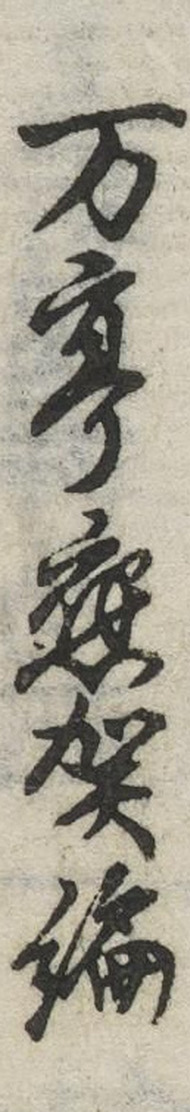万亭応賀編

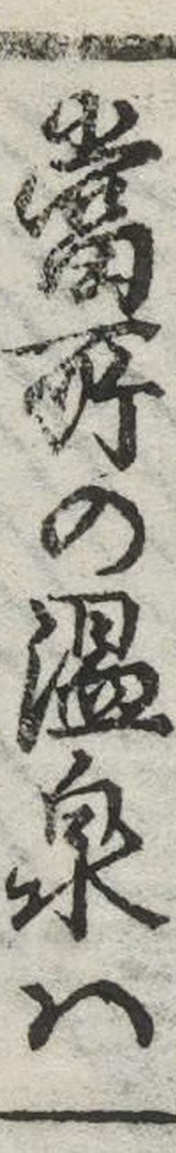当所の温泉は
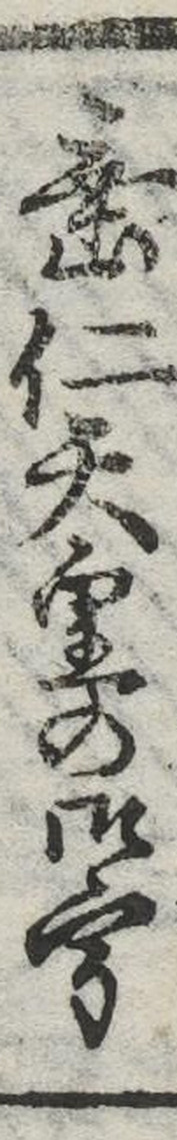垂仁天皇の御宇
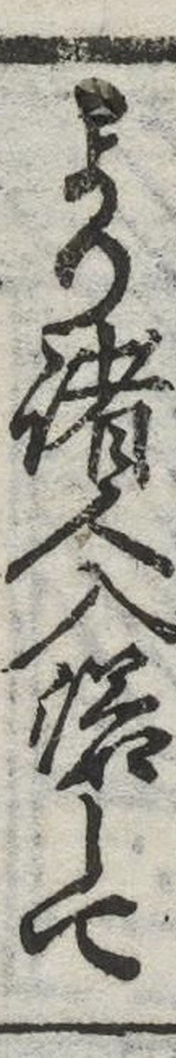より諸人入浴して
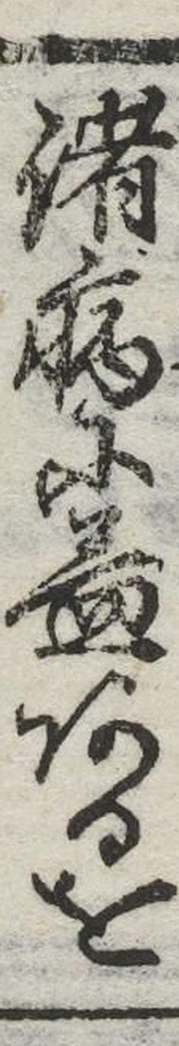諸秒に益あるを
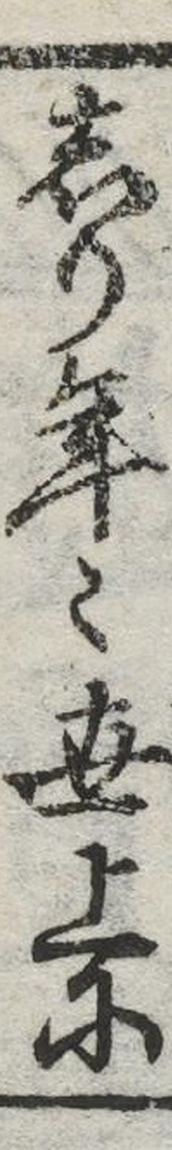しり年々世上に
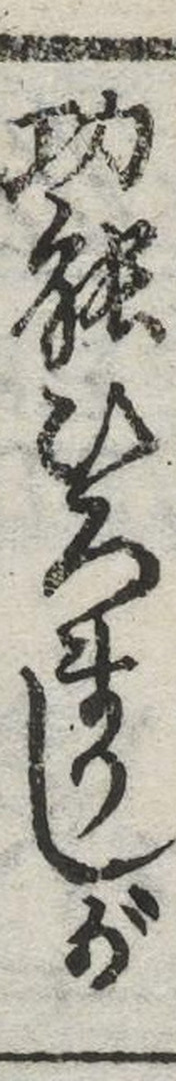功能ひろまりしが
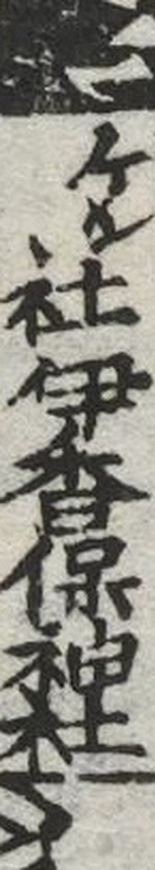ケン社伊香保神社
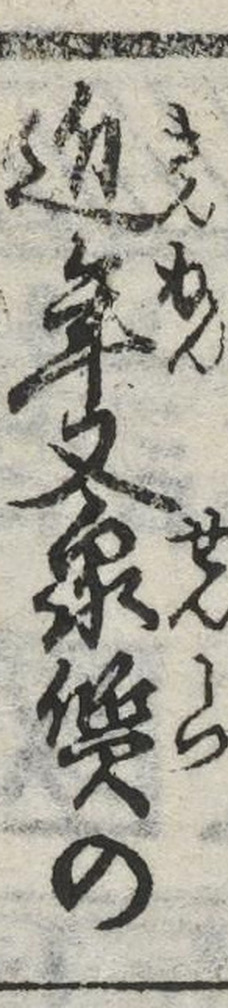近年又泉質の
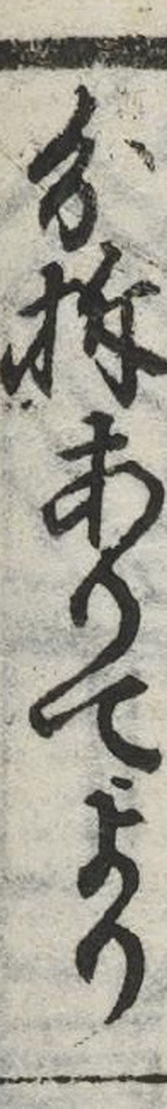分析ありてより
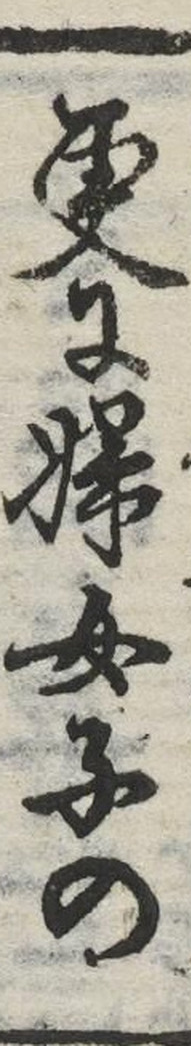更に婦女子の
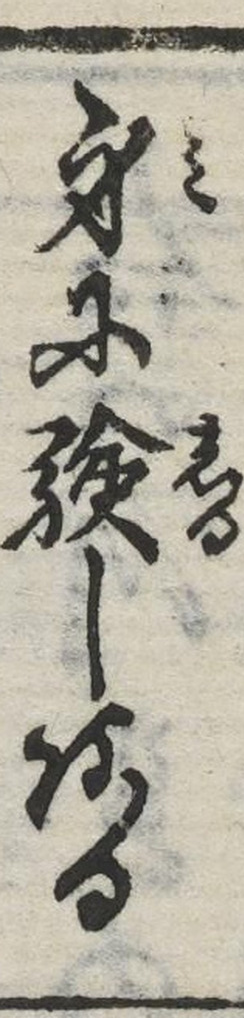身に験しある
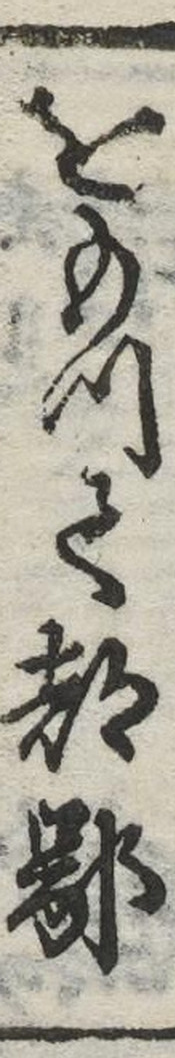をもつて都鄙
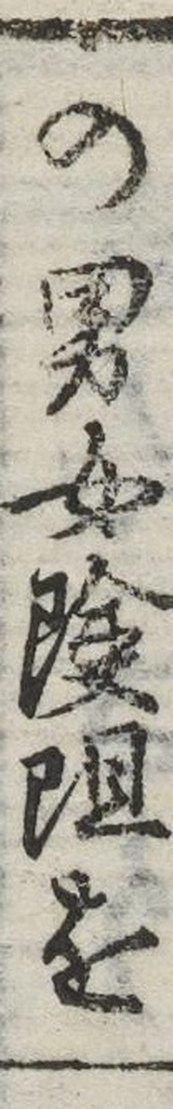の男女険阻を
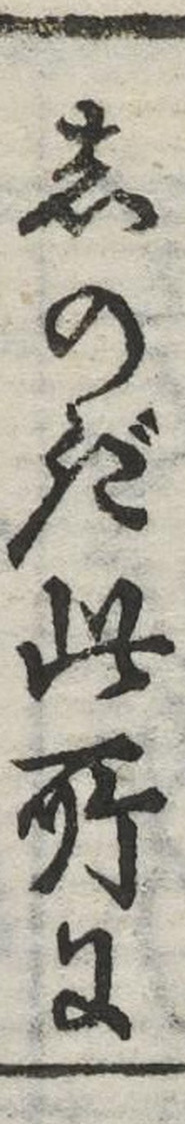しのぎ此所に
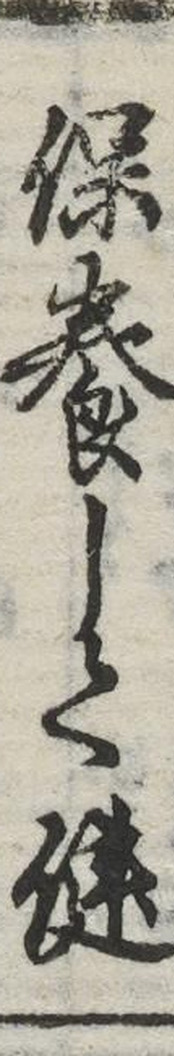保養して健
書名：諸國温泉遊覽記　全
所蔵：東京大学地震研究所図書室 Earthquake Research Institute Library, The University of Tokyo, JAPAN
